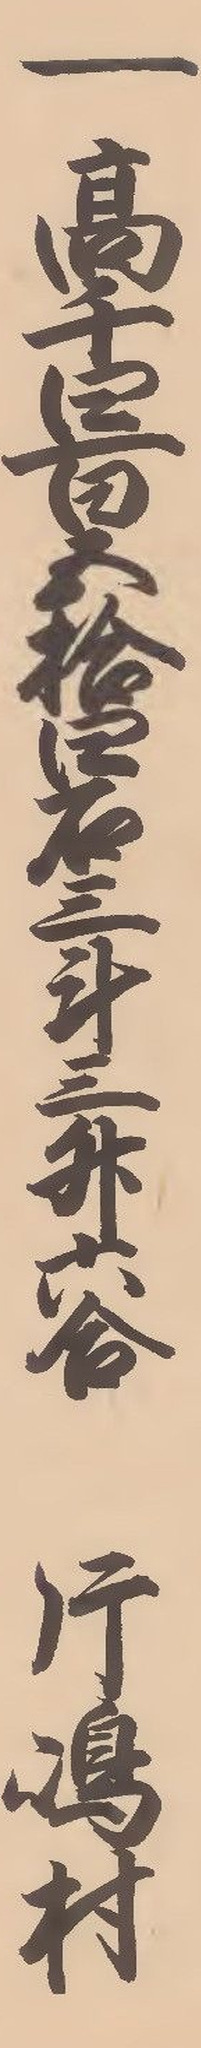一髙千四百五拾四石三斗三升六合片嶋村
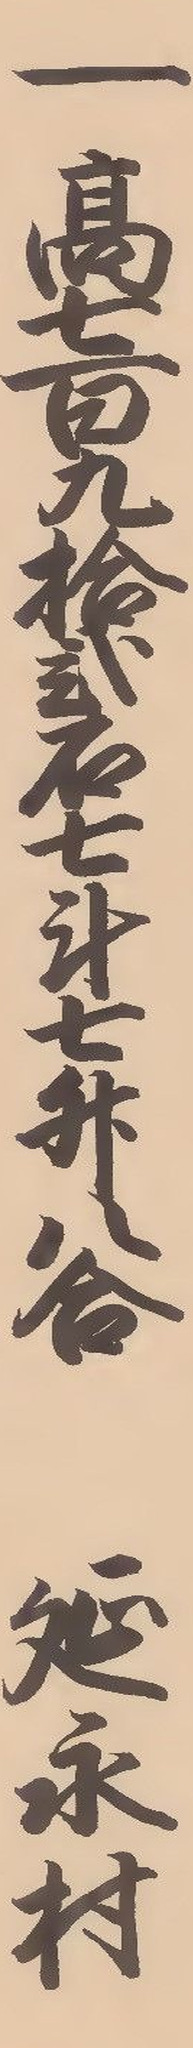一髙七百九拾弐石七斗七升八合延永村
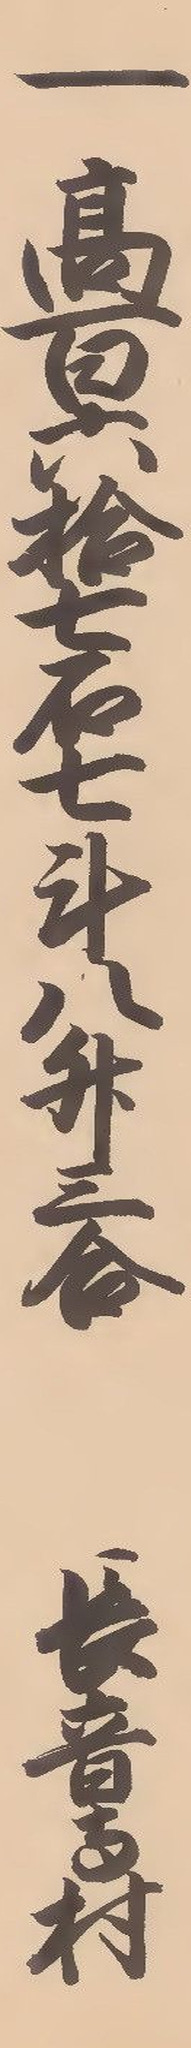一髙百六拾七石七斗八升三合長音寺村
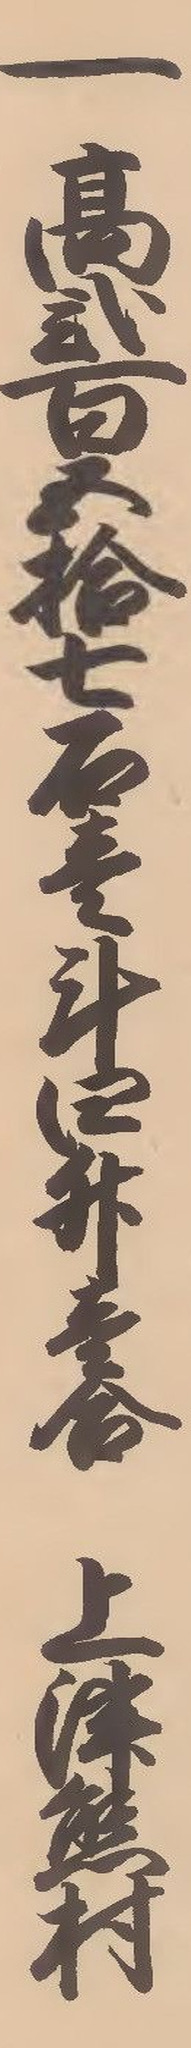一髙弐百五拾七石壱斗四升壱合上津熊村
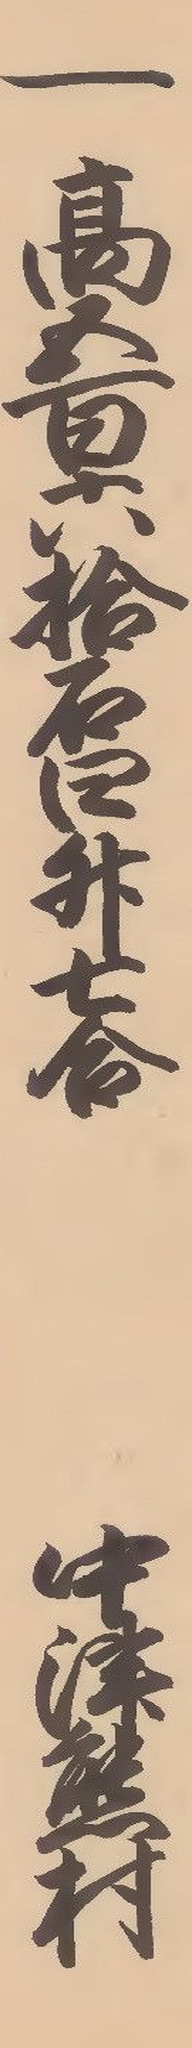一髙五百六拾石四升七合中津熊村
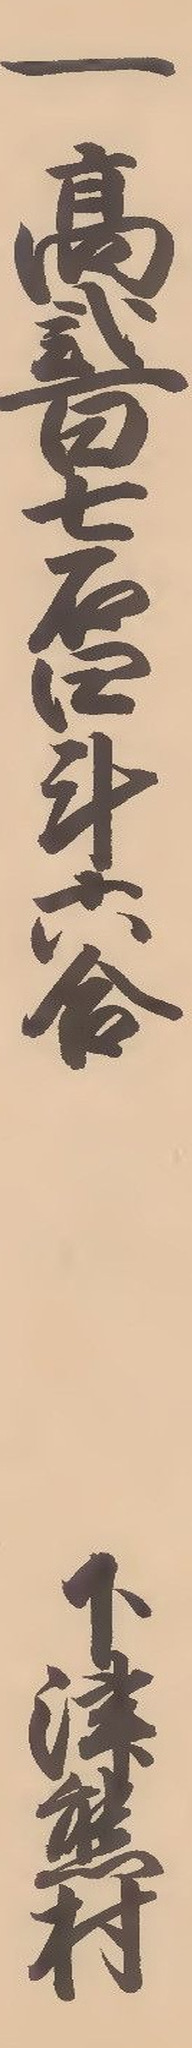一髙弐百七石四斗六合下津熊村
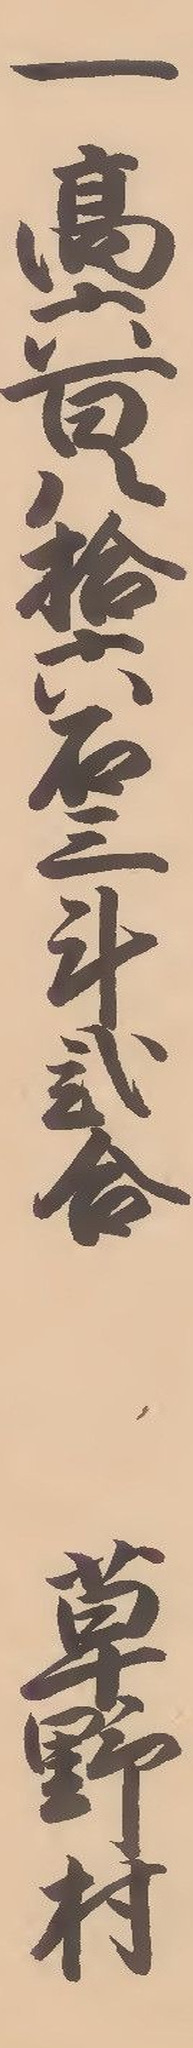一髙六百八拾六石三斗弐合草野村

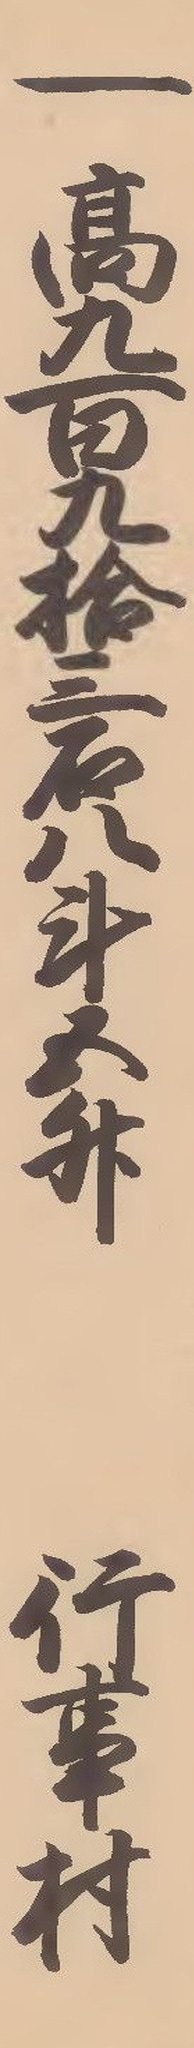一髙九百九拾三石八斗五升行事村
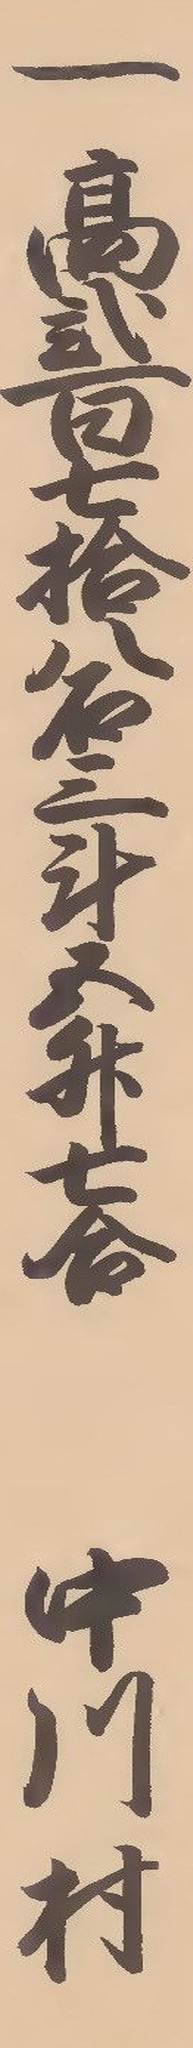一髙弐百七拾八石三斗五升七合中川村
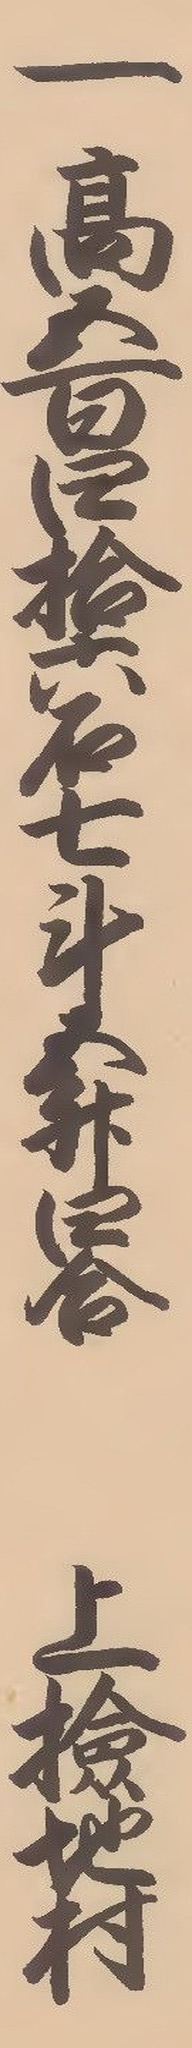一髙五百四拾六石七斗五升四合上檢地村
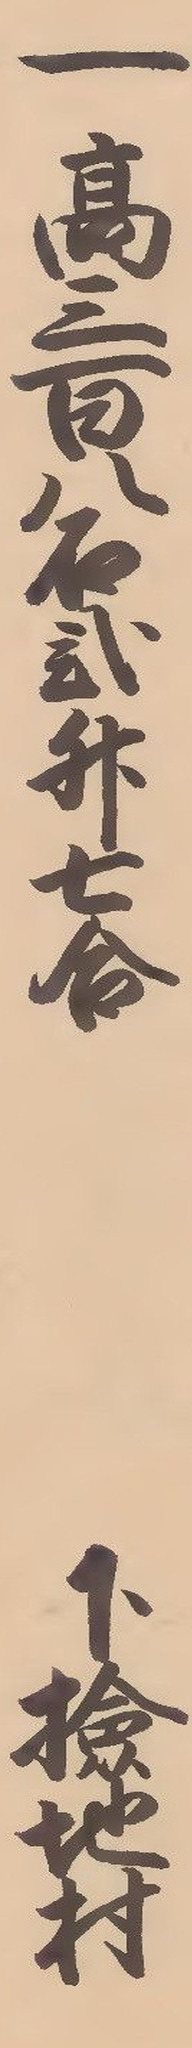一髙三百八石弐升七合下檢地村
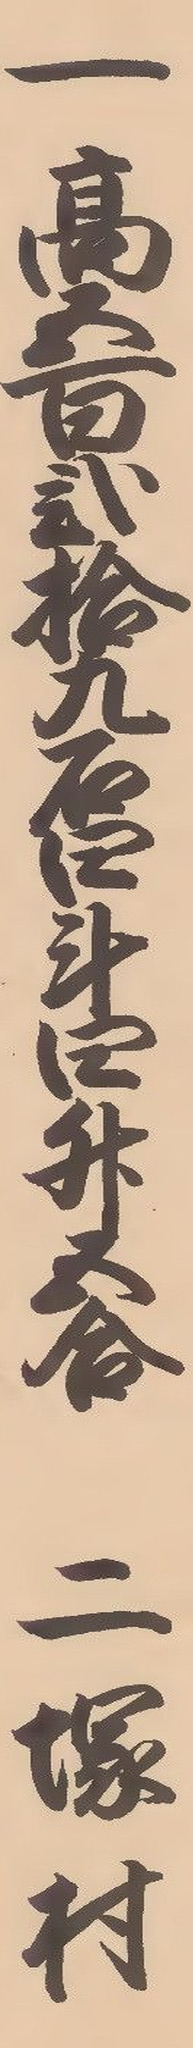一髙五百弐拾九石四斗四升五合二塚村
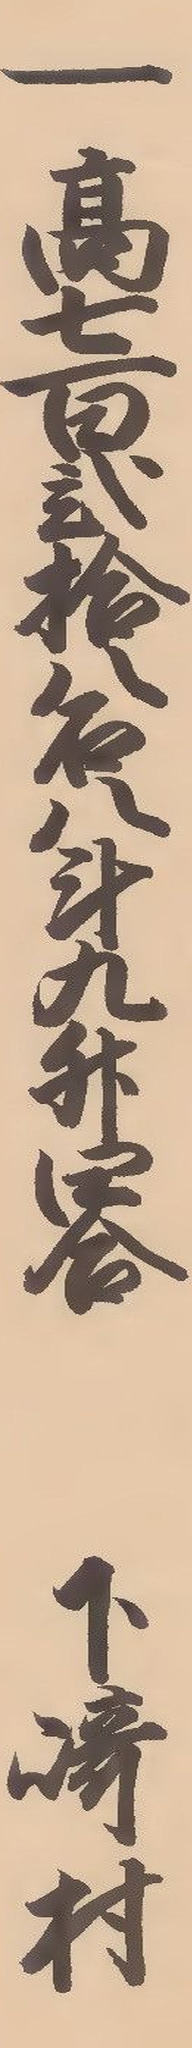一髙七百弐拾八石八斗九升四合下崎村
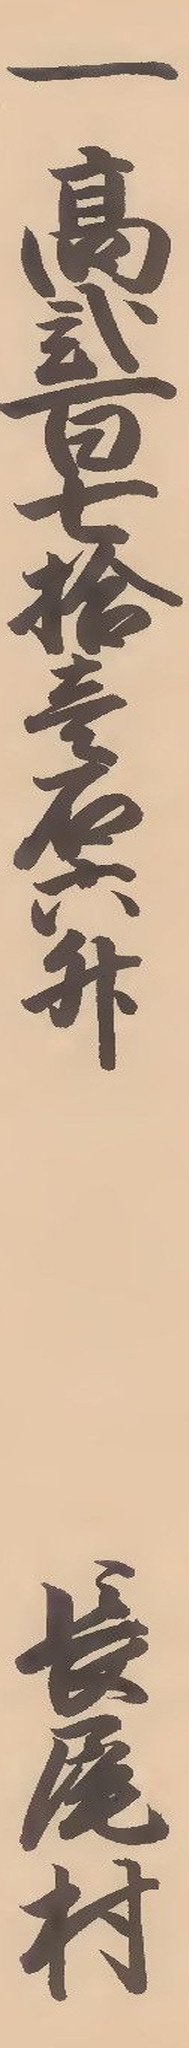一髙弐百七拾壱石六升長尾村
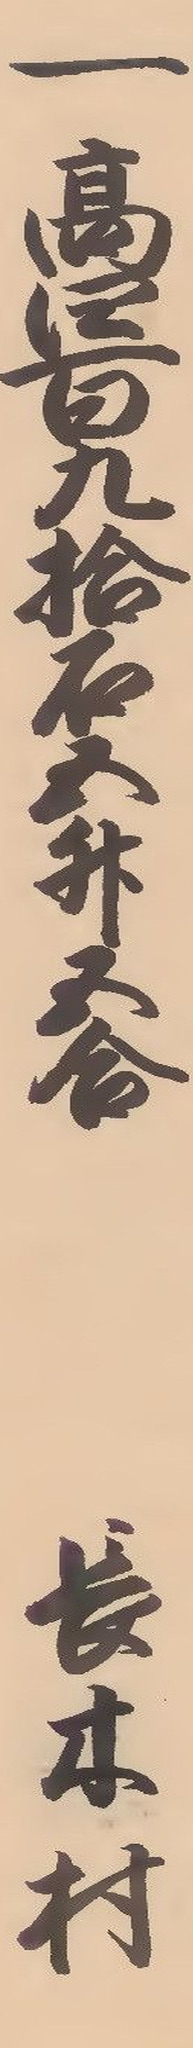一髙四百九拾石五升五合長木村

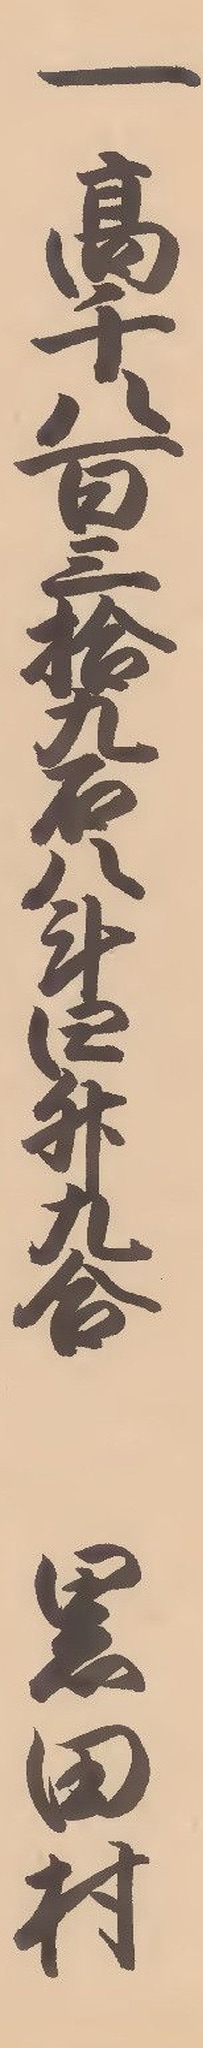一髙千八百三拾九石八斗四升九合黑田村
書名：豊前国郷帳
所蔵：国立公文書館 National Archives of Japan
